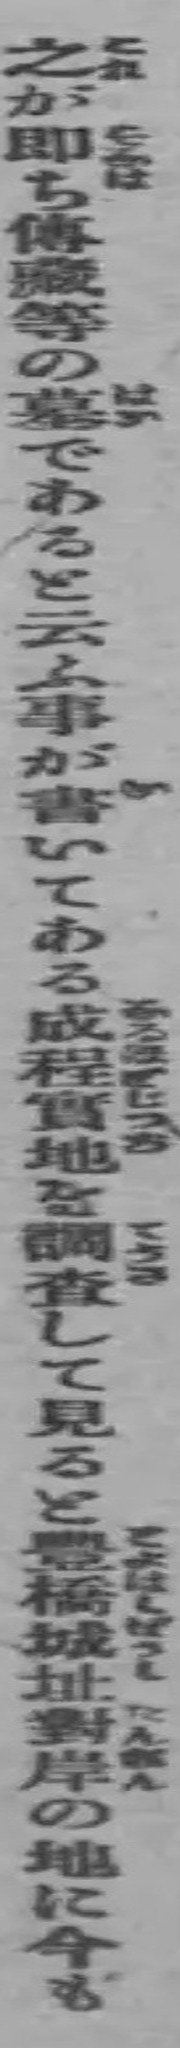之が即ち傳蔵等の墓であると云ふ事が書いてある成程実地を調査して見ると豊橋城址対岸の地に今も
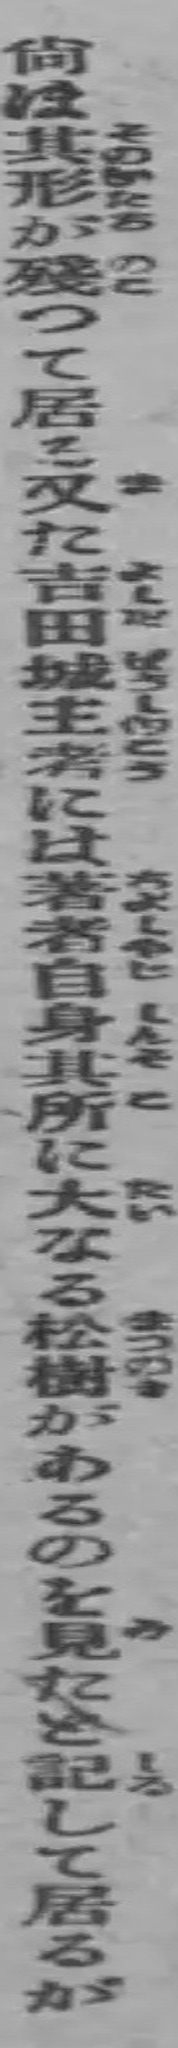尚ほ其形が残つて居る又た吉田城主考には著者自身其所に大なる松樹があるのを見たと記して居るが
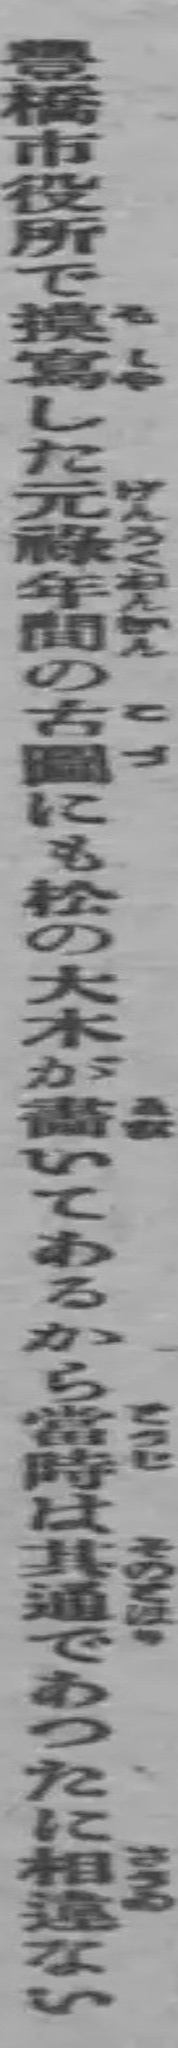豊橋市役所で模写した元禄年間の古図にも松の木が画いてあるから当時は其通であつたに相違ない
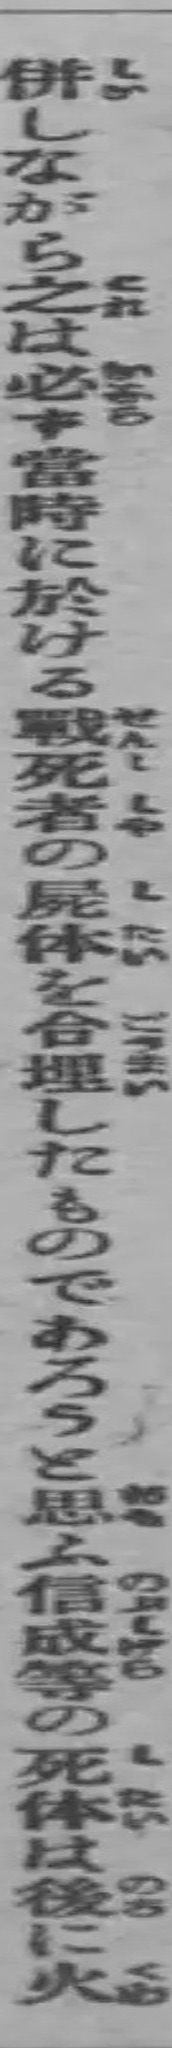併しながら之は必ず当時に於ける戦死者の屍体を合埋したものであろうと思ふ信成等の死体は後に火
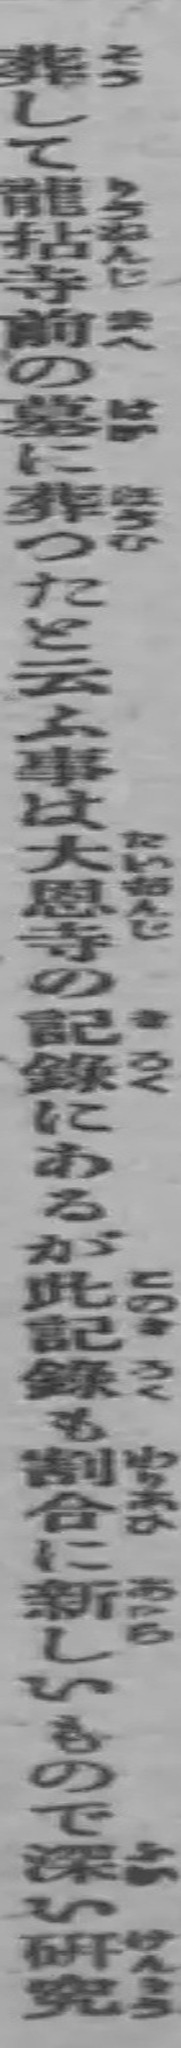葬して龍拈寺前の墓に葬つたとい云ふ事は大恩寺の記録にあるが此記録も割合に新しいもので深い研究
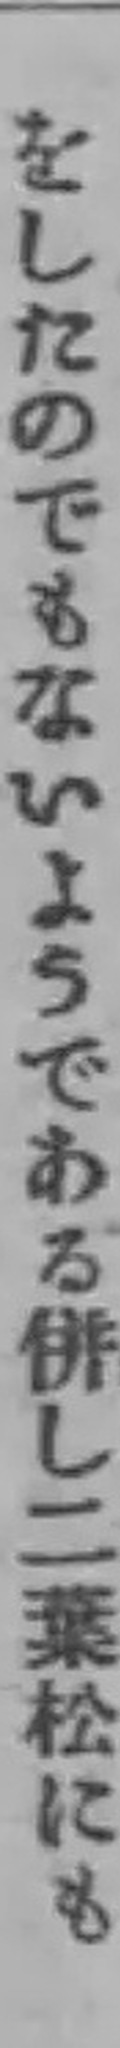をしたのでもないようである併し二葉松にも
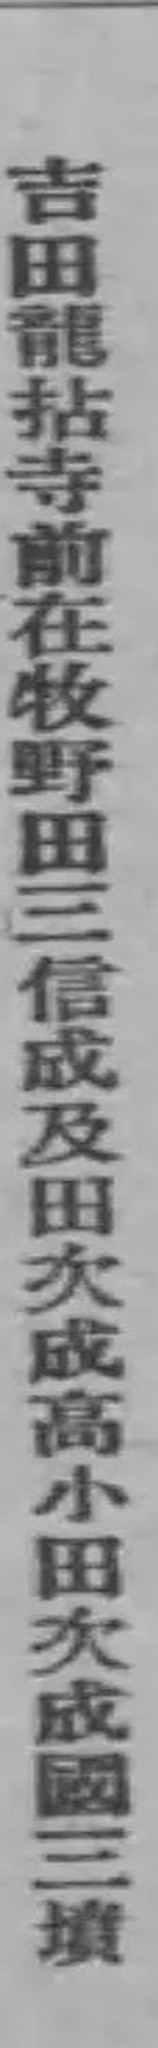吉田龍拈寺前在牧野田三信成及田次成高小田次成国三墳
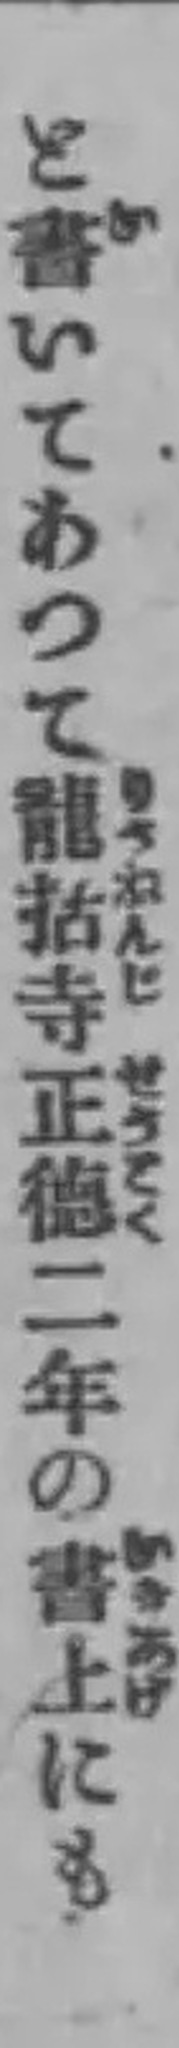と書いてあつて龍拈寺正徳二年の書上にも
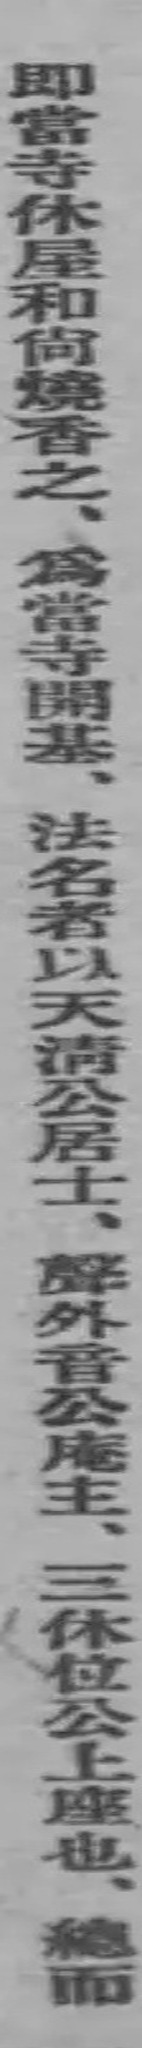即当寺休屋和尚焼香之、為当寺開基、法名者以天清公居士、声外音公庵主、三休位公上座也、総而
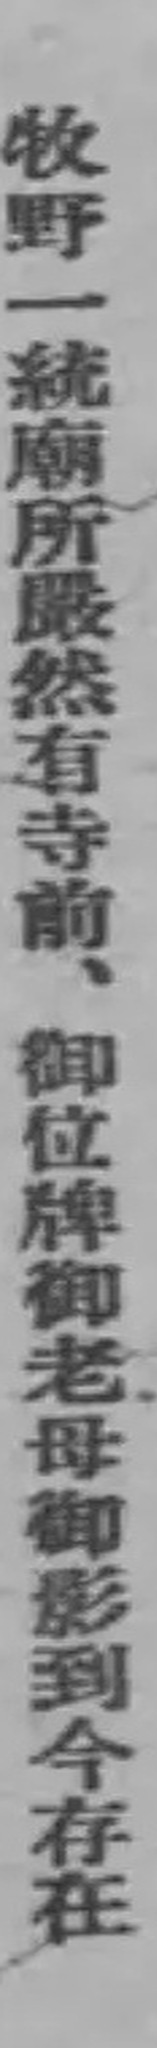牧野一統廟所厳然有寺前、御位牌御老母御影到今存在
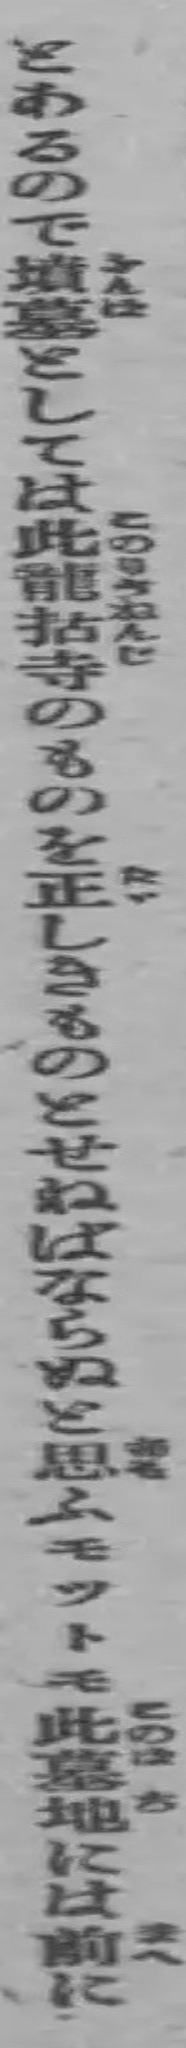とあるので墳墓としては此龍拈寺のものを正しきものとせねばならぬと思ふモツトモ此墓地には前に
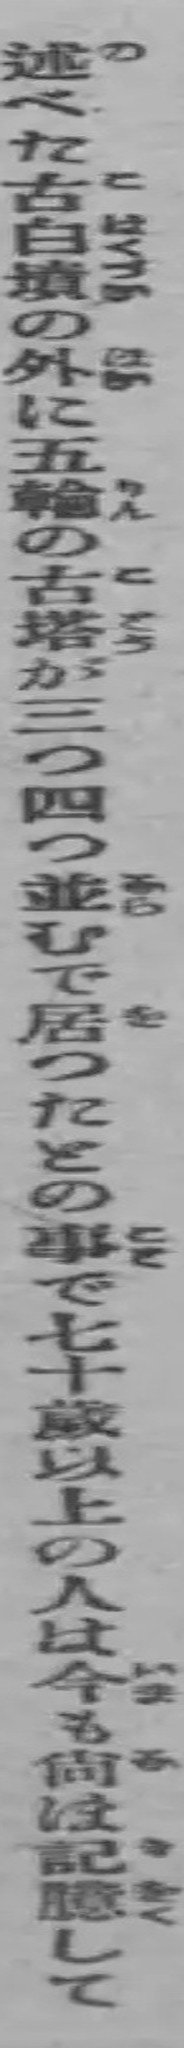述べた古白墳の外に五輪の古塔が三つ四つ並むで居つたとの事で七十歳以上の人は今も尚ほ記憶して
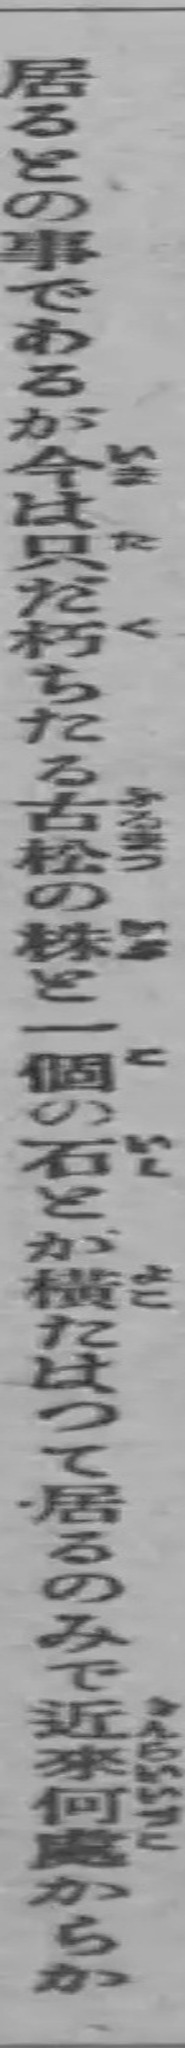居るとの事であるが今は只だ朽ちたる古松の株と一個の石とが横たはつて居るのみで近来何処からか
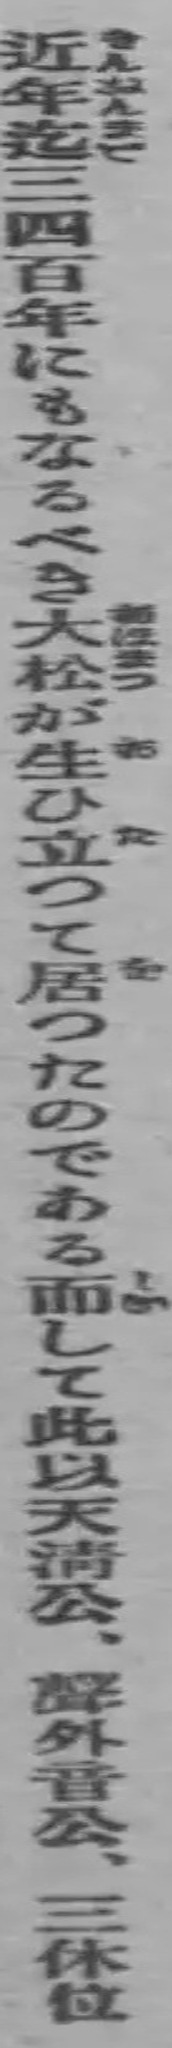近年迄三四百年にもなるべき大松が生ひ立つて居つたのである而して此以天清公、声外音公、三休位
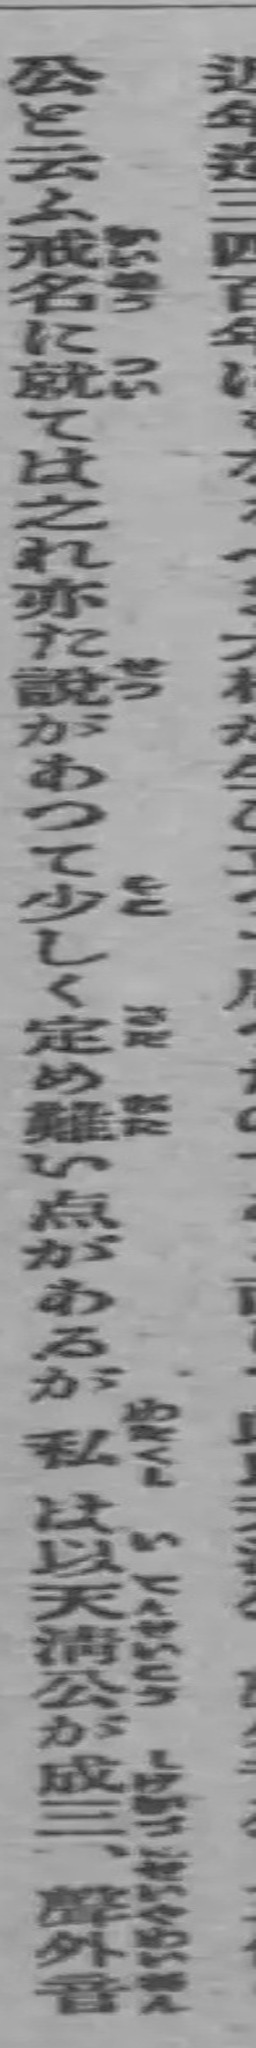公と云ふ戒名に就ては之れ亦た説があつて少しく定め難い点があるが私は以天清公が成三、声外音

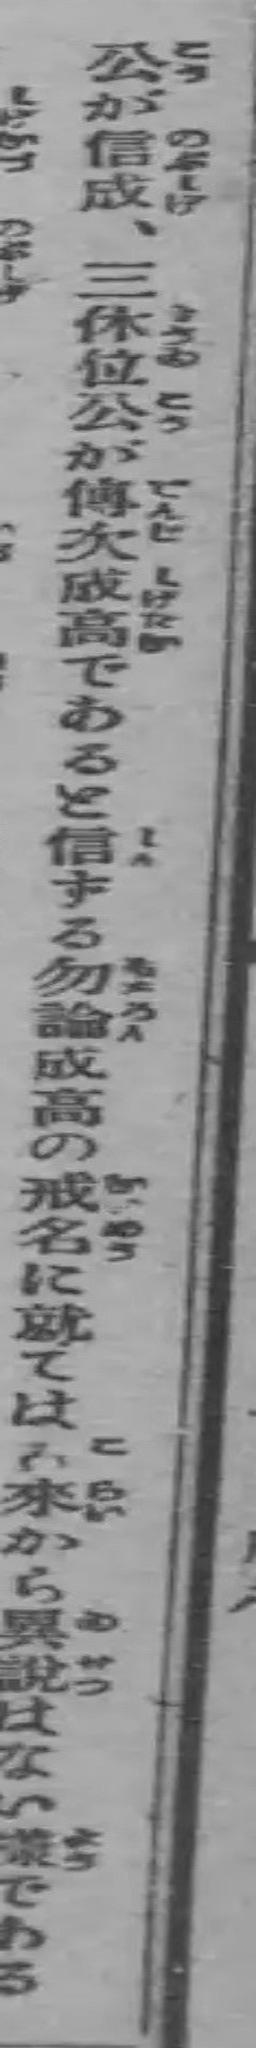公が信成、三休位公が傳次成高であると信ずる勿論成高の戒名に就ては古来から異説はない様である
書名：豊橋市史談
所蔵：国立国会図書館 National Diet Library, JAPAN
